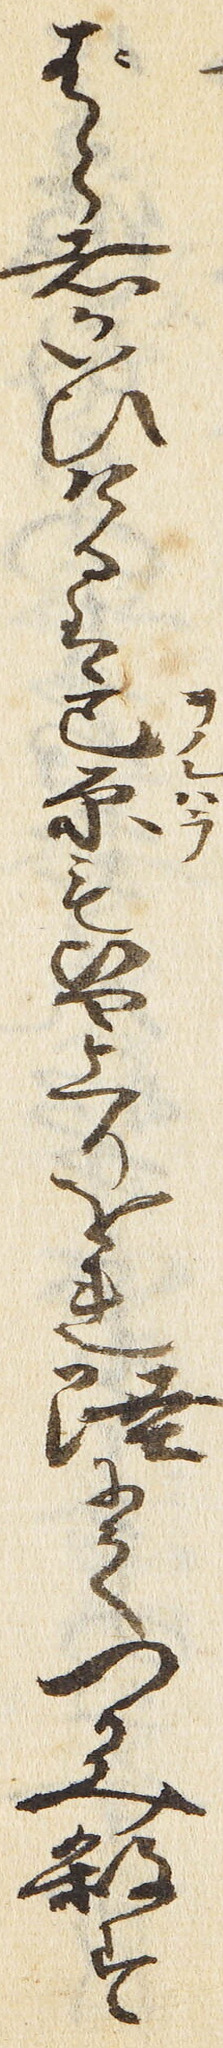ばら者かいひけるは己原も皆上りをれ陸にてつかみ殺す
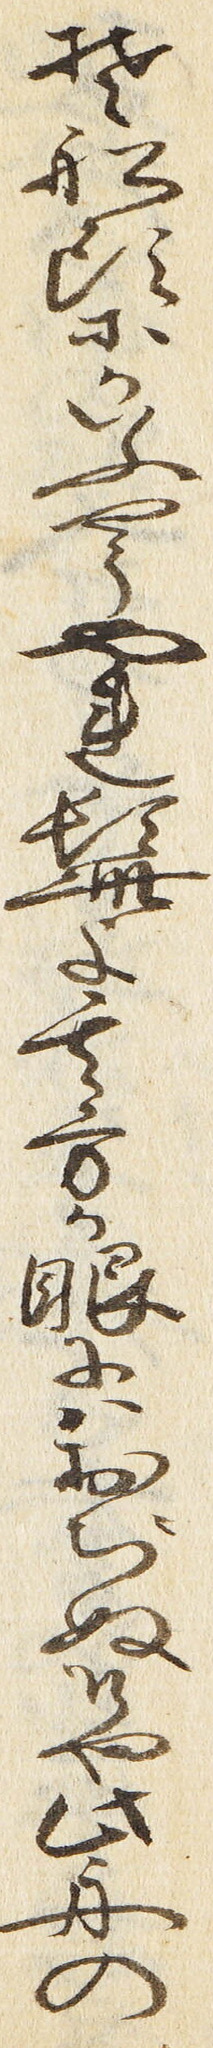そ船頭等かいふやうやれ髭よ其方か眼にはおぢぬそや此舟の
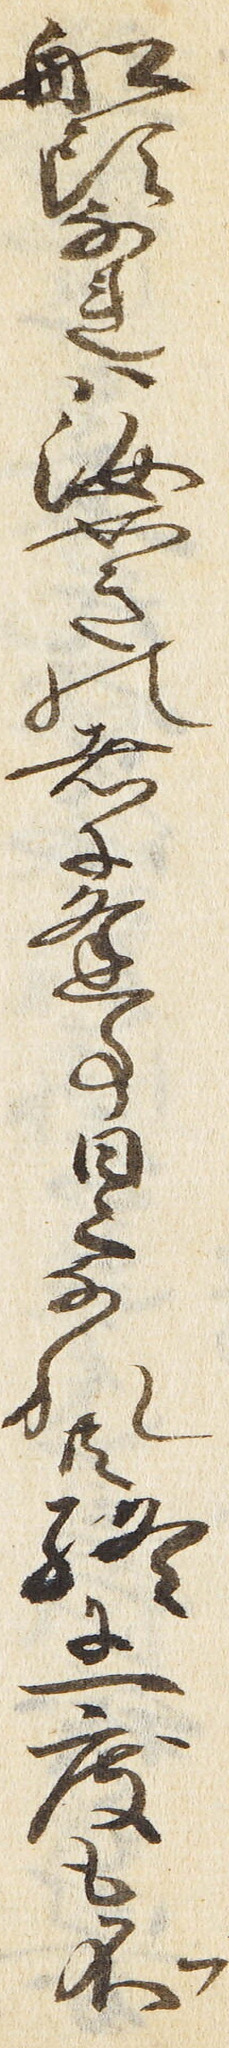船頭なれは汝如きの者に逢事日々なれ共終に一度も不
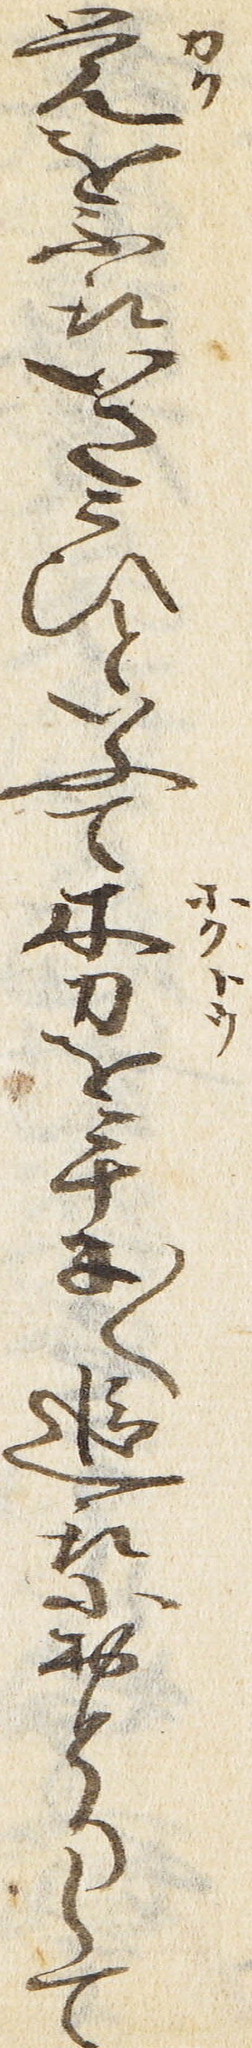覚を不取いさこひといふて木刀を手に〳〵追取小おとりして
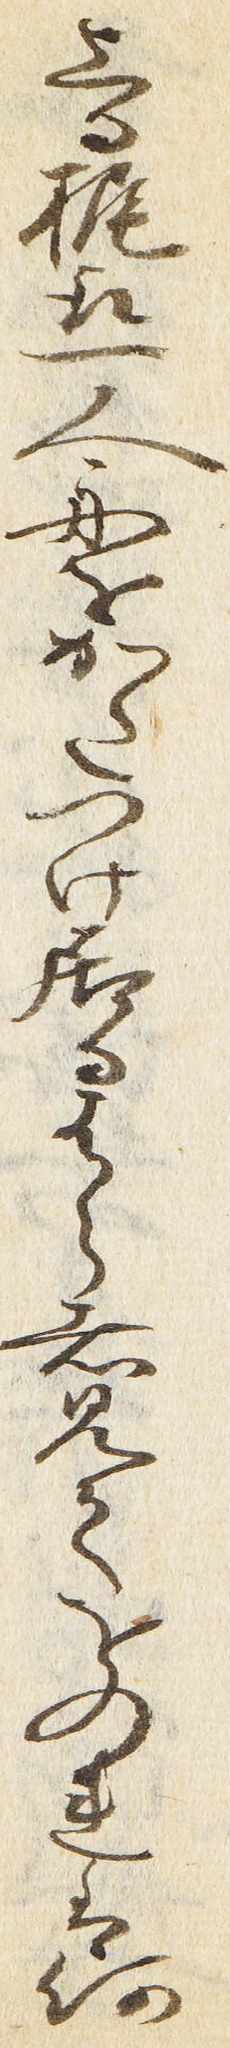上る梶取一人舟をかたつけ居るはら者見てをのれは何
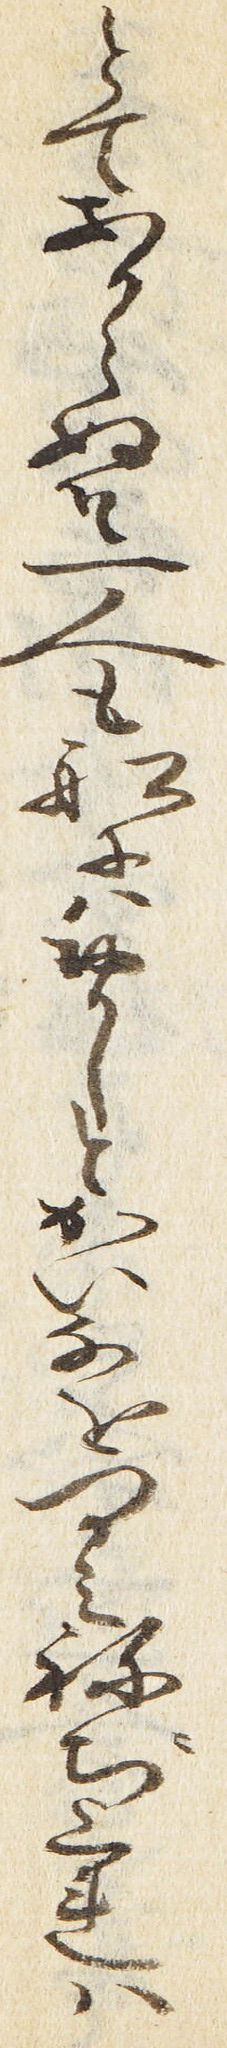とてあからぬそ一人も船にはおかしとかいなをつかみねぢ上れは
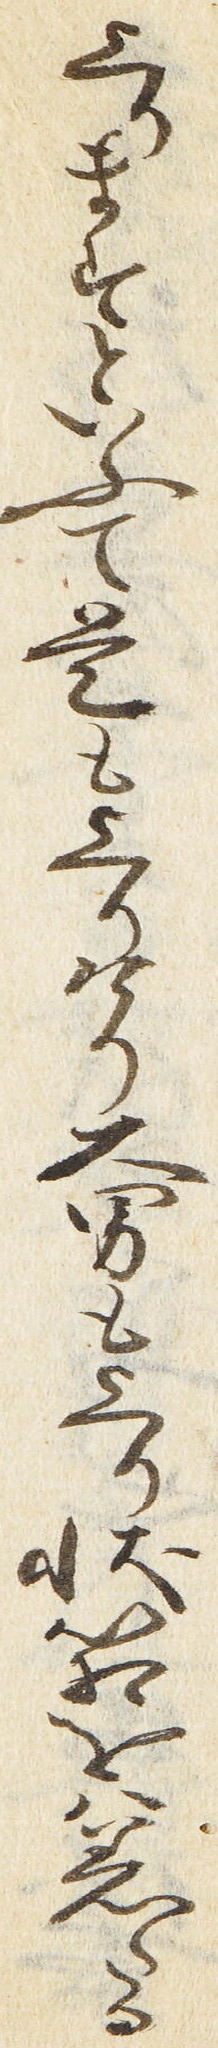上りますといふて是も上りけり大男も上り状箱をは着たる
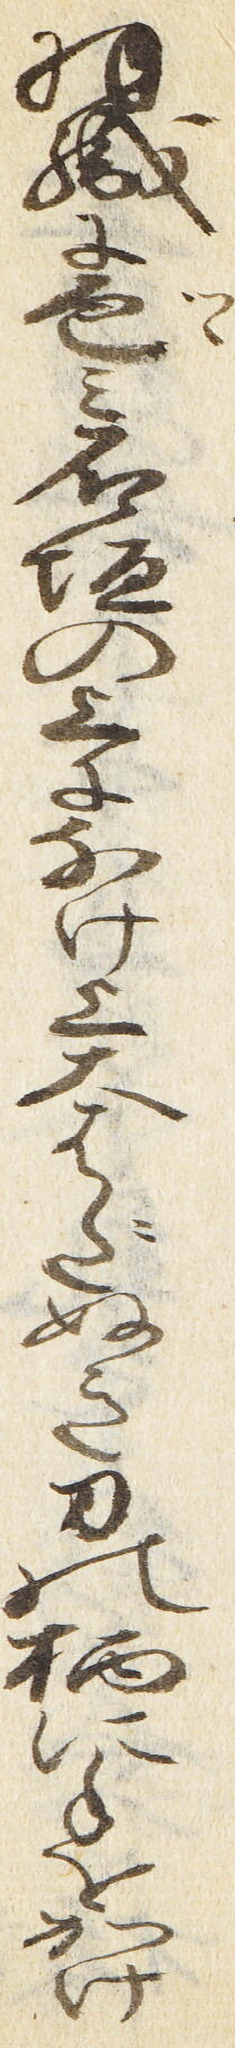羽織に包み石垣の上になけ上大はだぬき刀の柄に手をかけ
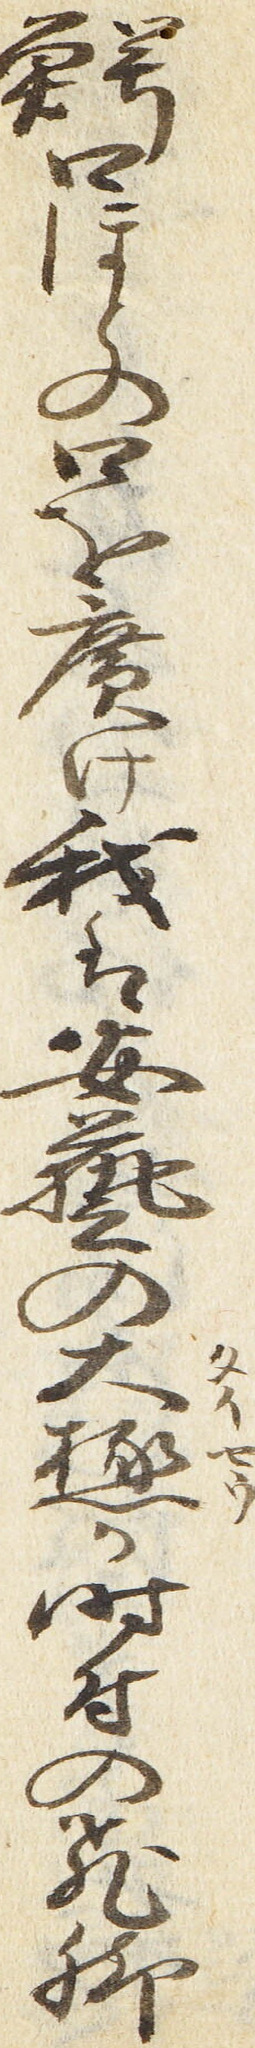鰐口ほとの口を広け我は安芸の大掾？か時付の飛脚
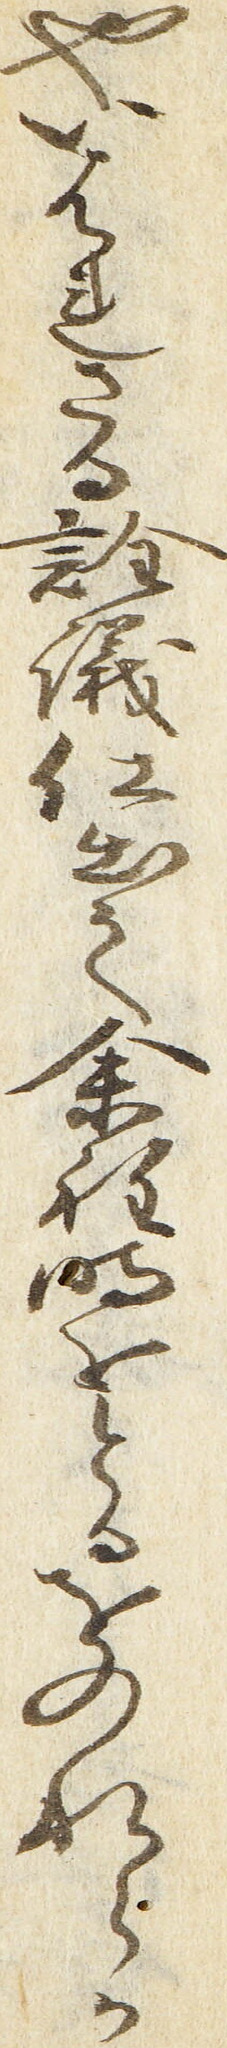やいはれさる詮儀仕出て余程時をとるをのれらか

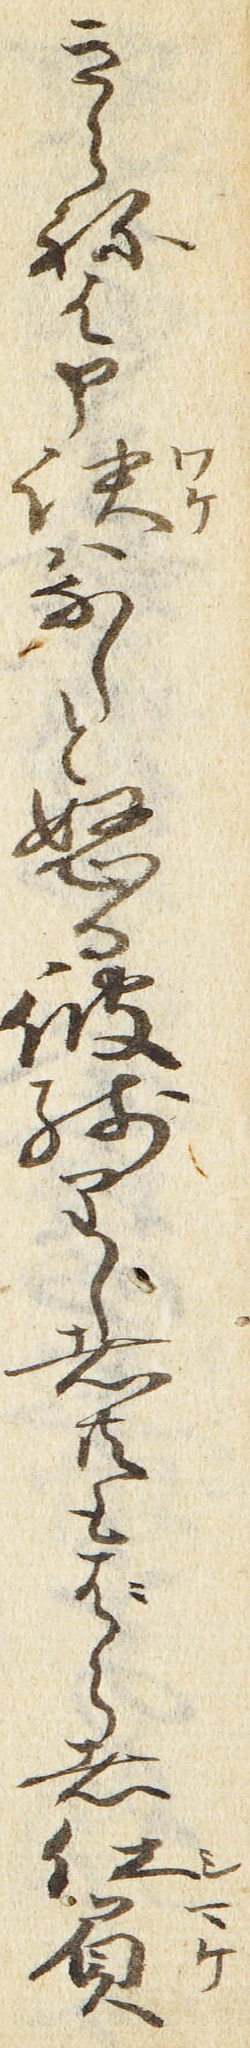きらねは申訳はなしと怒る彼残りし者共もばら者仕負
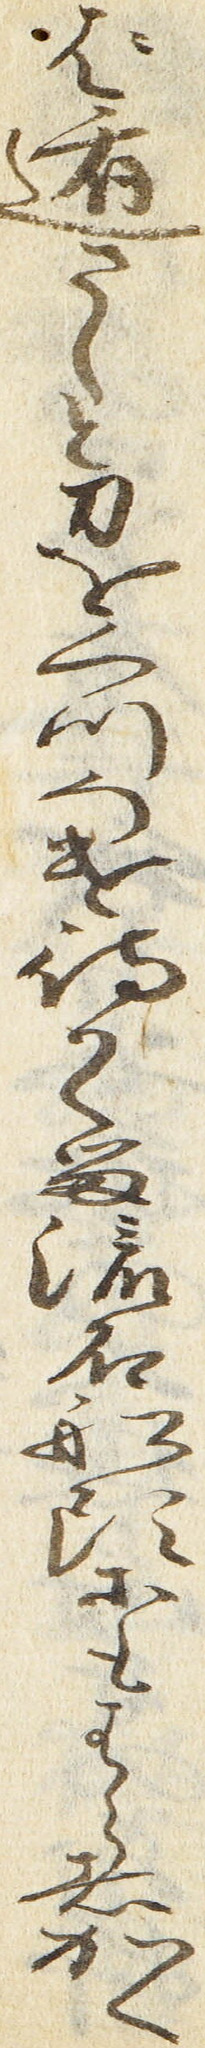ば遁さしと刀をくつつけ待かくる流石船頭等もはら者かく
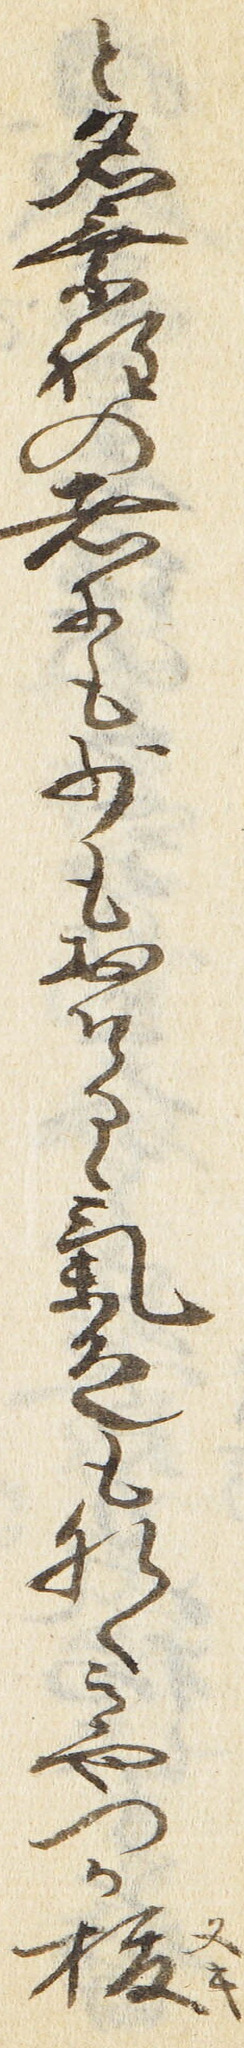と名乗程の者にも少もおそるゝ気色もなくきやつか抜
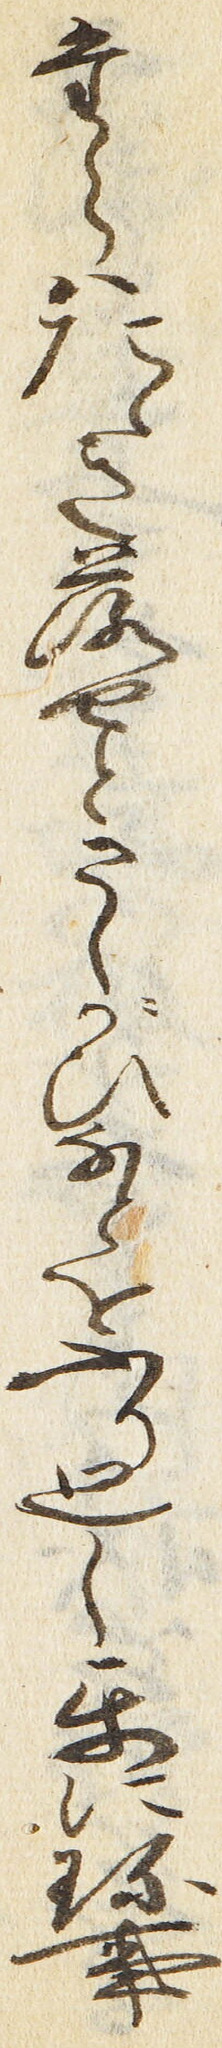とらはたゝき落せとさしがひなとをふり廻し互に珍事
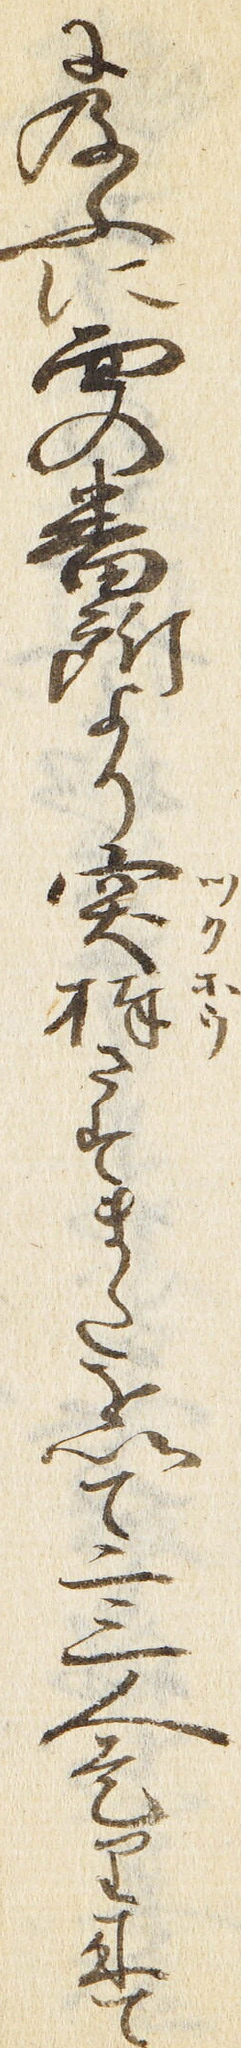に及ふに面の番所より突棒さすまたを以て二三人走り来て
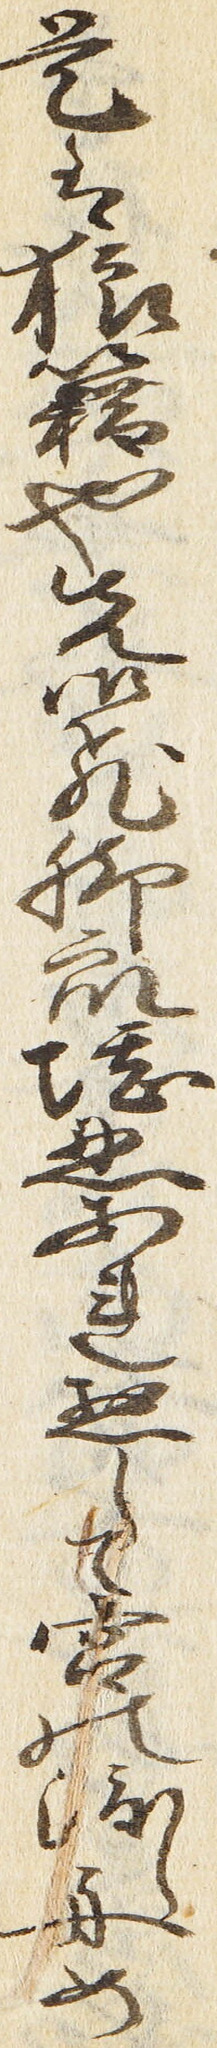是は狼籍や先御飛脚衆堪忍あれ惣して宮の渡し舟め
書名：海陸世話日記
